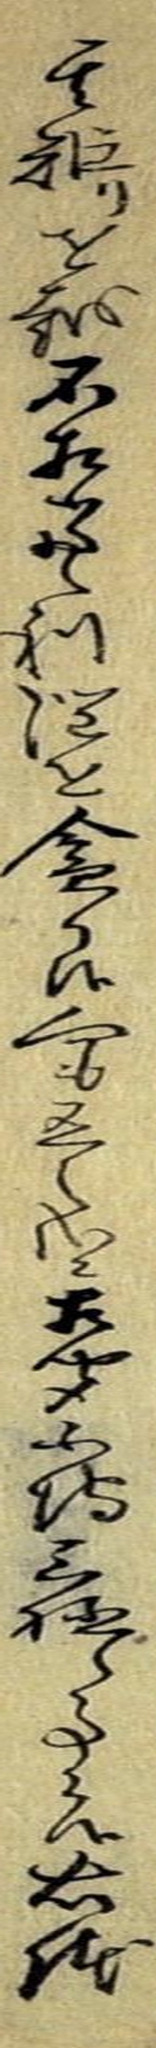其距りを越不相当之利潤を貪り候向も有之哉に相聞不埒至極之事に候右体
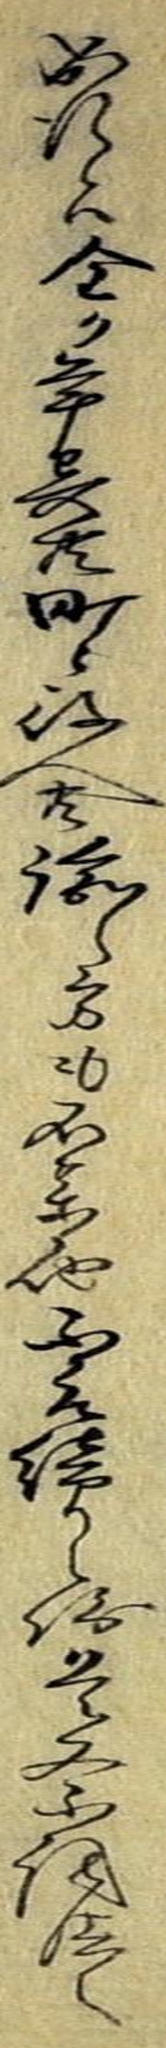成行は全ク年寄共町役人共誰方も不参届不取締り之儀且又不調法之
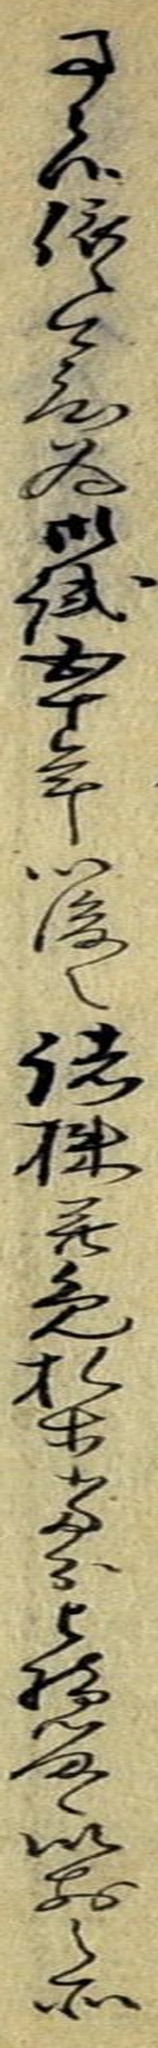事に候依之今度為御試五十年以後之諸株并免札等当分被差留候以前之所
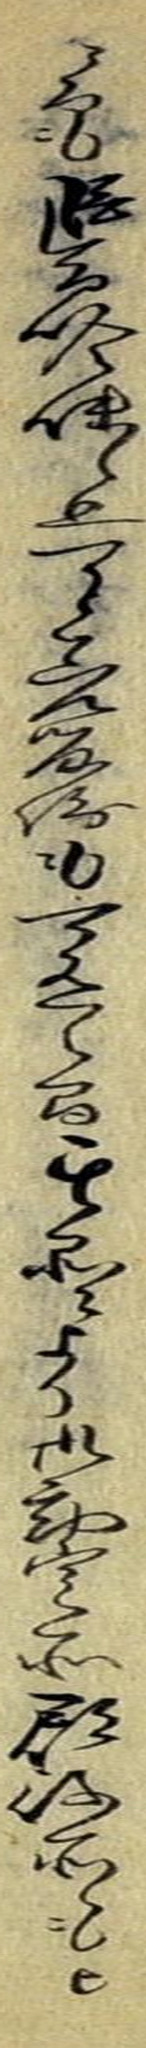に而も追而吟味之上可被差留儀も有之候間其品により御勘定所郡役所へも被
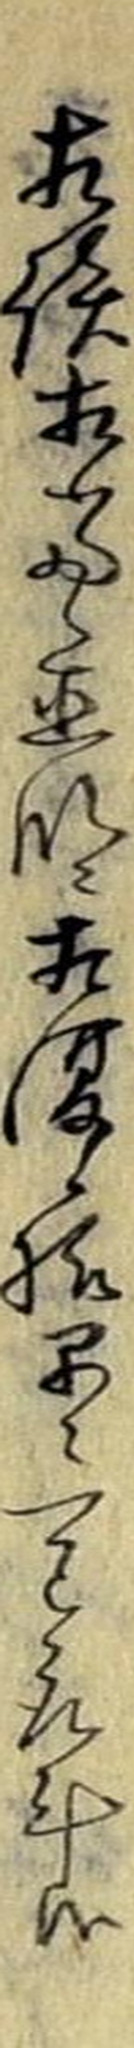相談相当候直段に相復候様早々可被取斗候
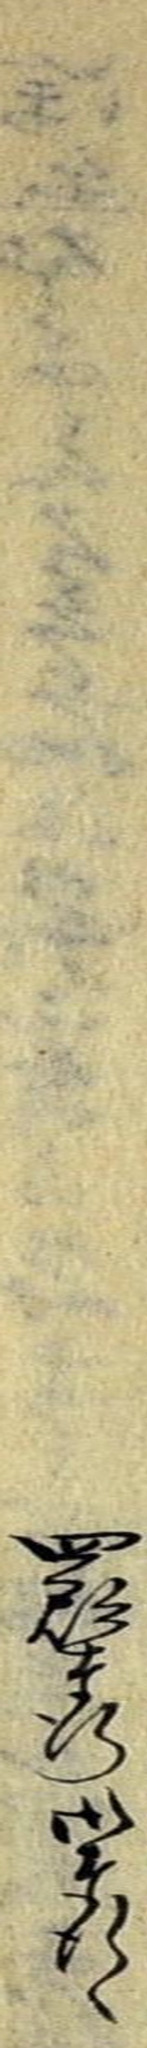四郡奉行御奉行へ
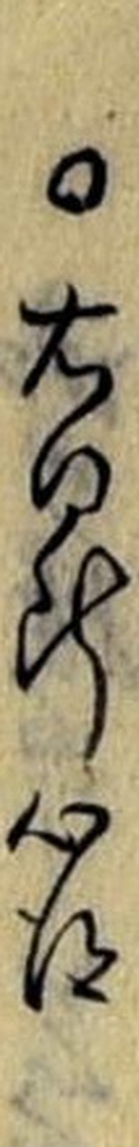○右同断心得
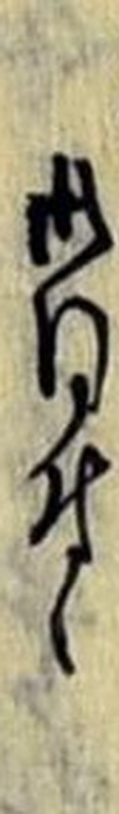御目付へ
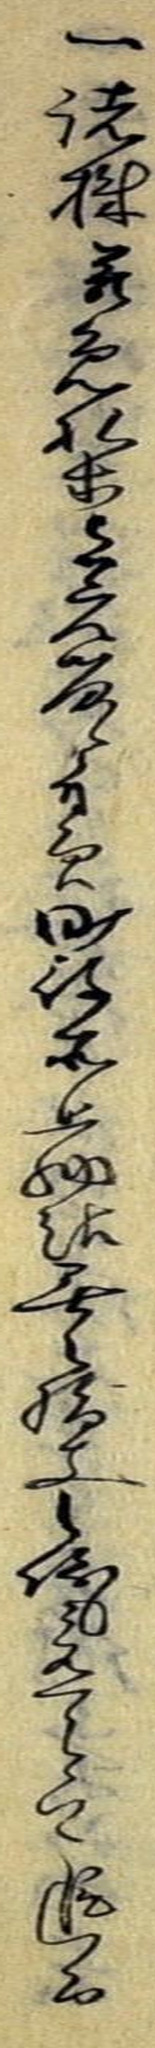○諸株并免札等被差留候に付而は町役所上納銀無之指支之儀も有之候はヽ追而
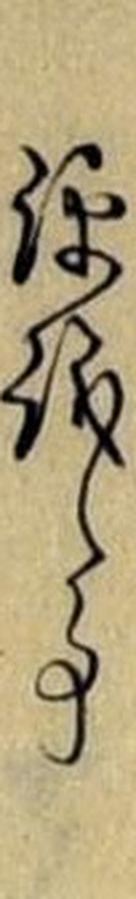評議之事
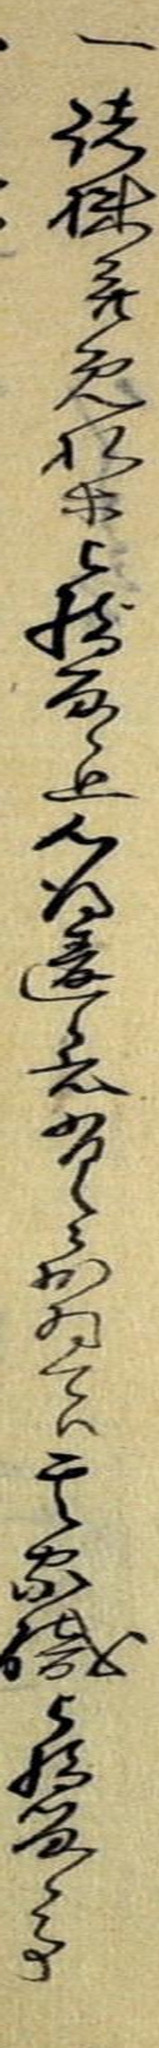一諸株并免札等被指留候上心得違之者有之におゐては其家職被指留候事
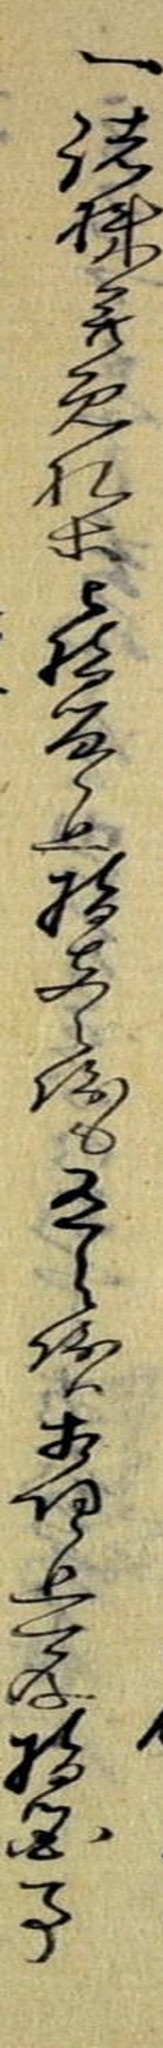一諸株并免札等被指留候上指支之儀も有之儀は相伺候上可及指図事
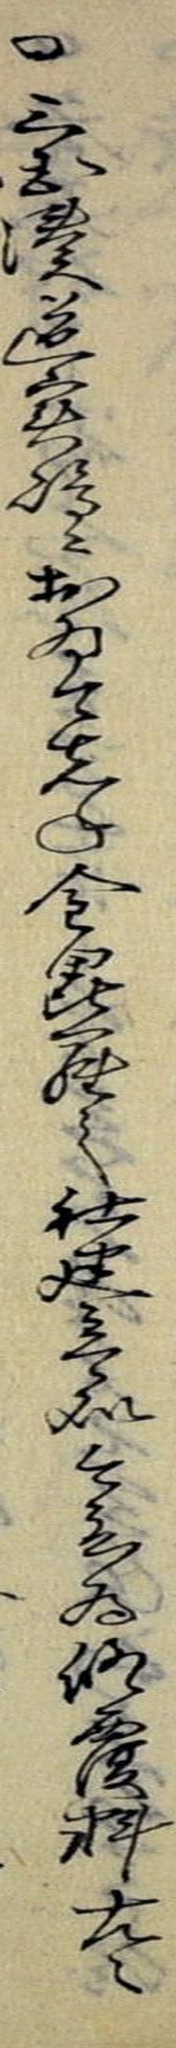○三国湊道実嶋におゐて先年金毘羅之社建立候処今度為修覆料左之
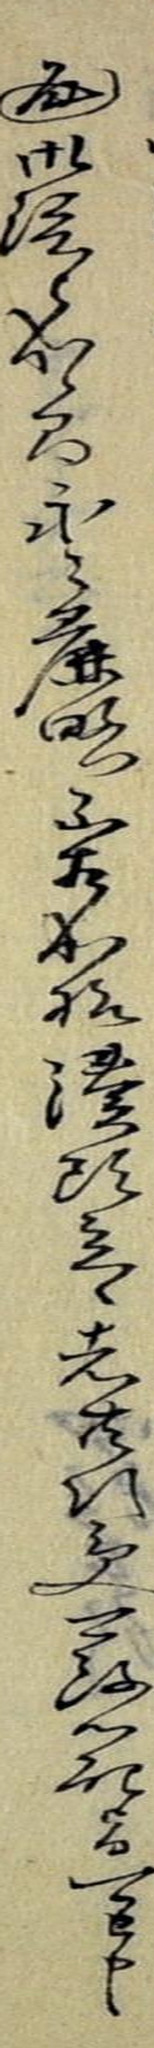通御渡被成候間永々廉略不相成様湊頭立候者共引受可致心配旨可被申
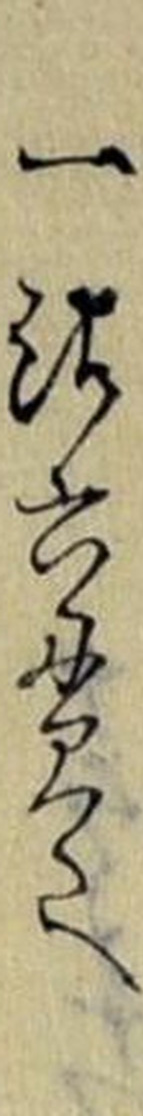一銀六貫匁
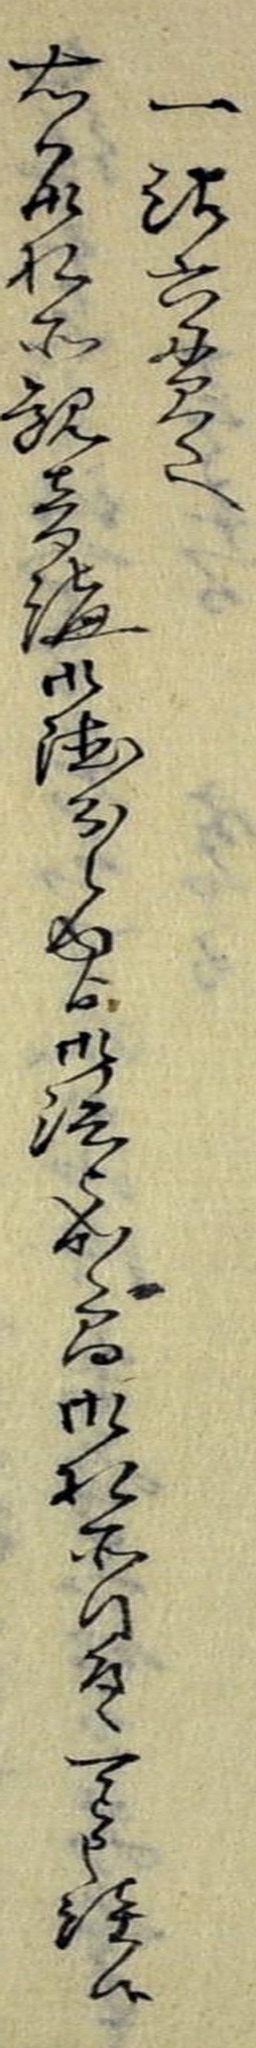右は御札所観音講御徳分之内ゟ御渡被成候間御札所目付へ可被申談候
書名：命令之部 六
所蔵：福井県文書館 Fukui Prefectural Archives
